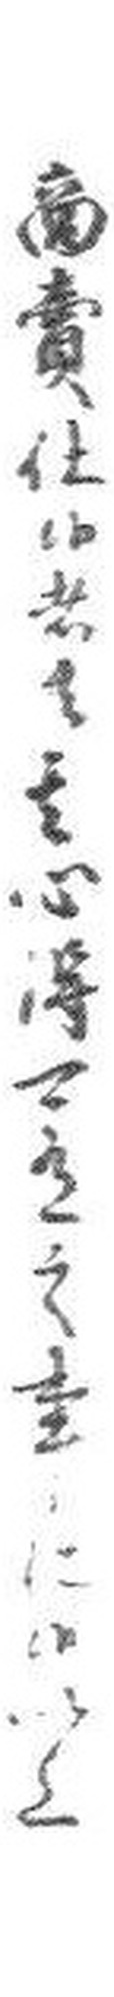商売仕候者者其心得可有之事に候以上
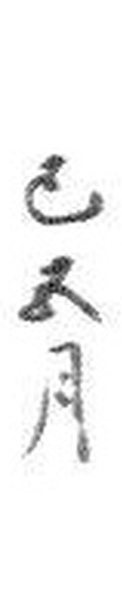巳五月
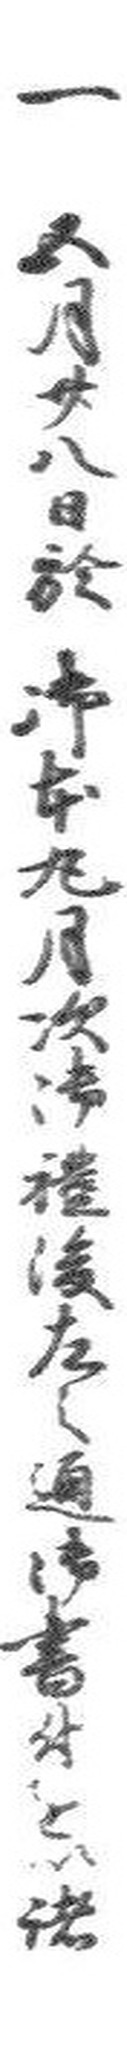一五月廿八日於御本丸月次御礼後左之通御書付を以諸
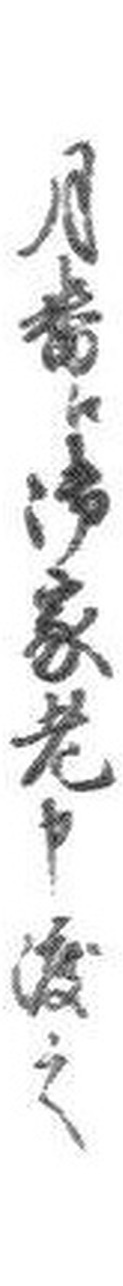月番江御家老申渡之

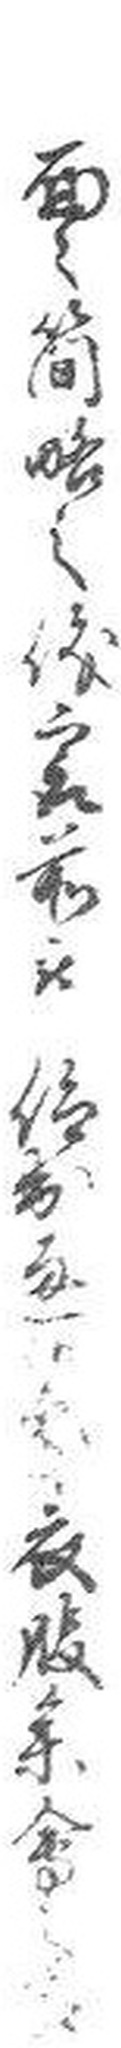面々簡略之儀最前被仰出通之処衣服参会之節
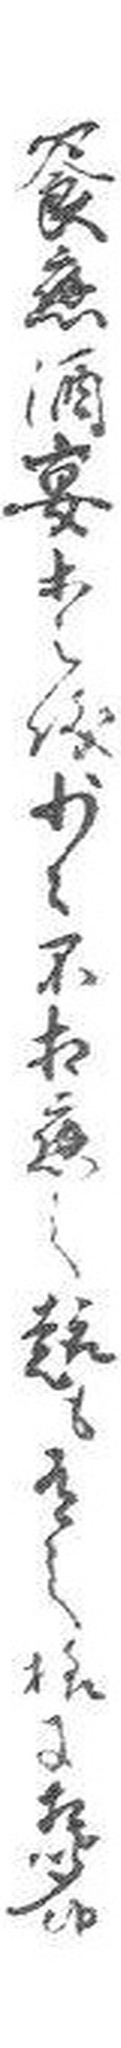饗応酒宴等之儀少々不相応之趣も有之様に相聞候
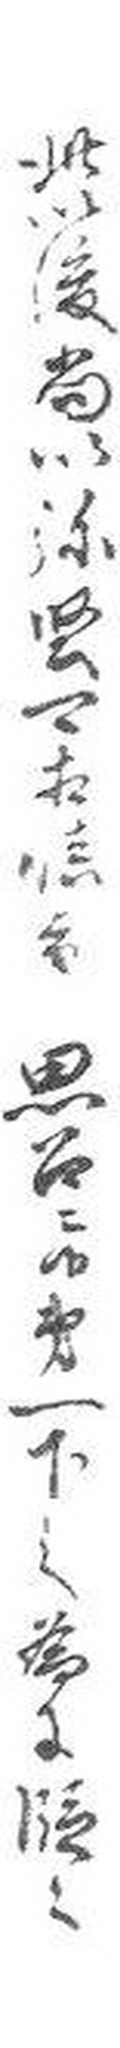此以後尚以弥堅可相慎旨思召ニ候第一下之為に段々
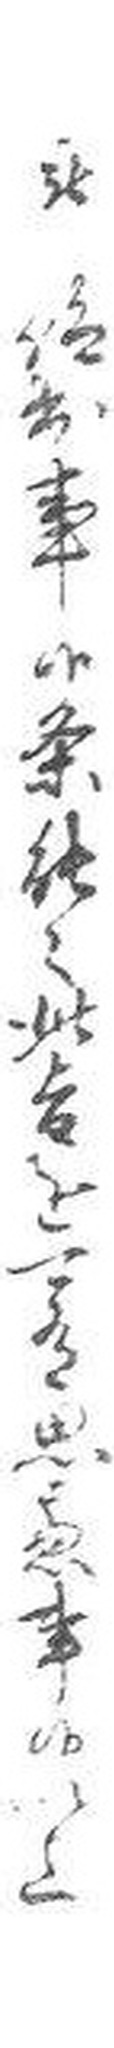被仰出事候条能々此旨を可有思慮事候以上
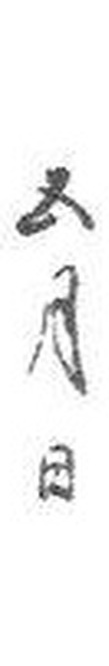五月日
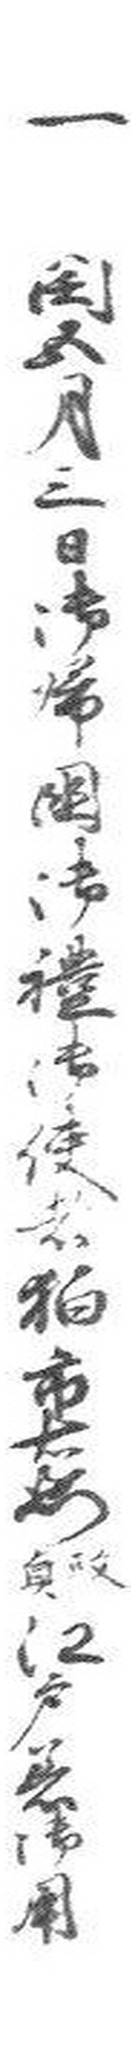一閏五月三日御帰国御礼御使者狛市右衛門政貞江戸着御用
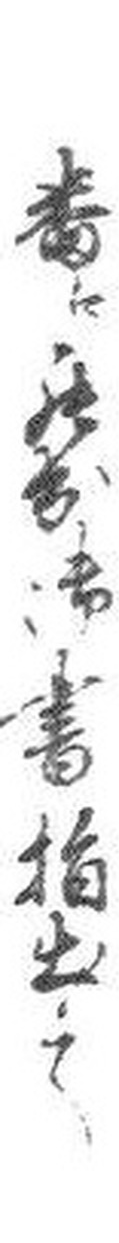番江罷出御書指出之
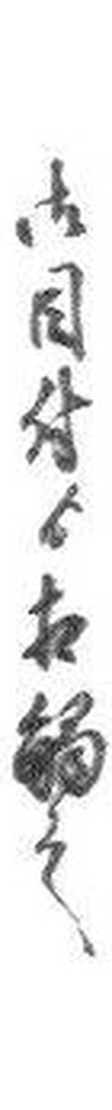御目付ゟ相触之
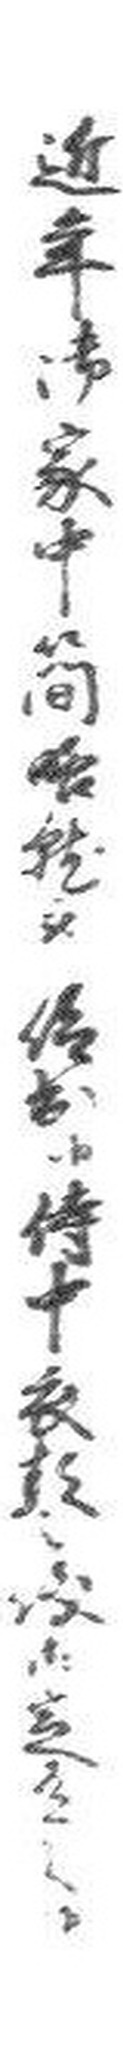近年御家中簡略就被仰出候侍中衣類之儀御定有之候
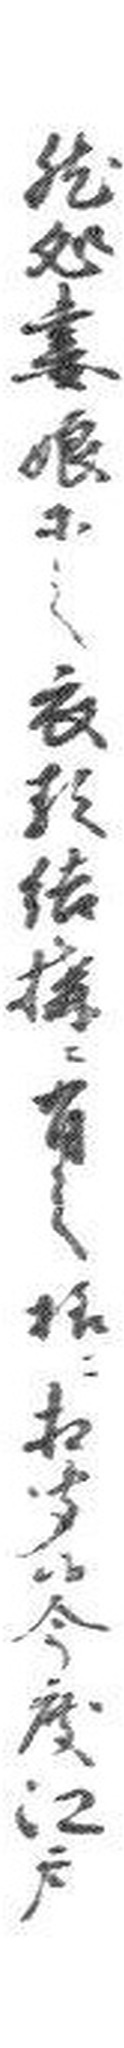然処妻娘等之衣類結構ニ有之様ニ相聞候今度江戸
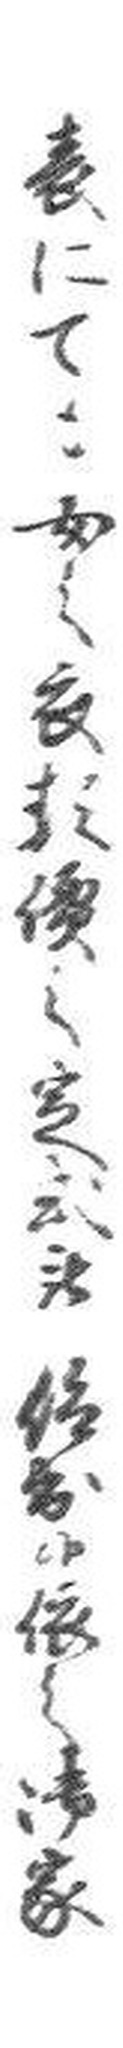表にても女之衣類價之定式被仰出候依之御家
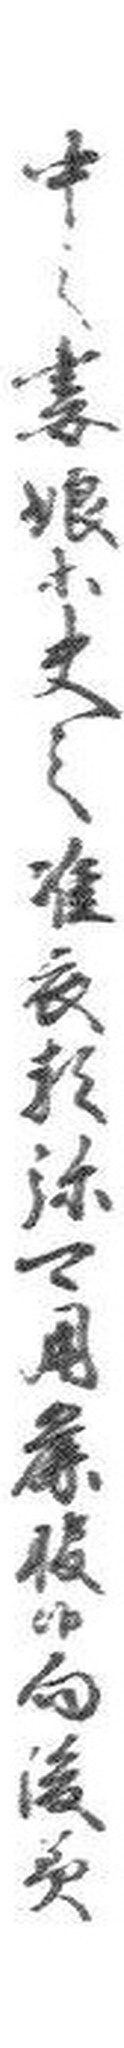中之妻娘等夫之准衣類弥可用麁服候向後美
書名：家譜 二十九 吉邦公 従正徳二年到正徳三年
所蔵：福井県文書館 Fukui Prefectural Archives
